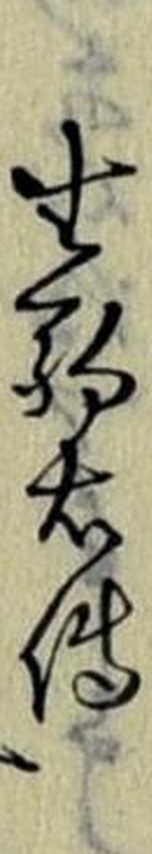生駒右伝
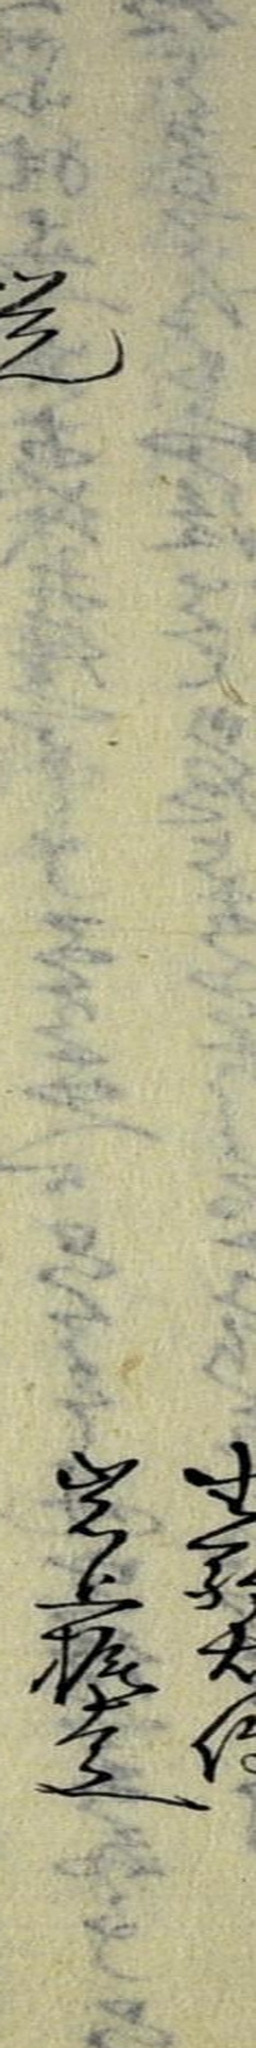覚岩上梶大夫
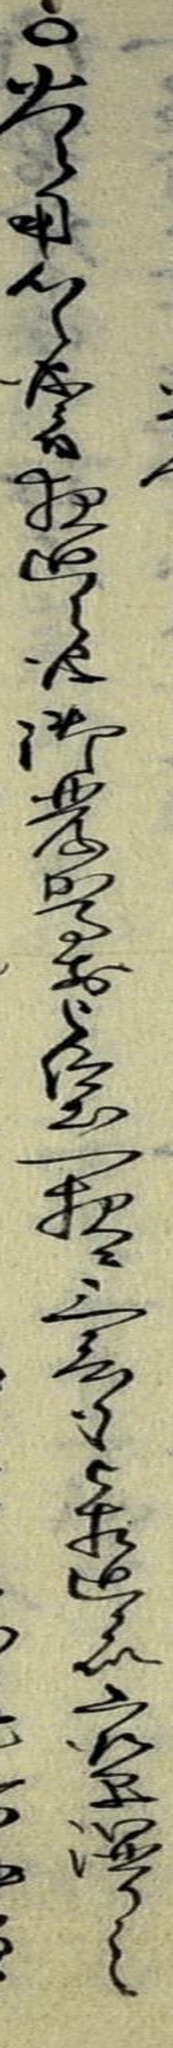〇火之用心之儀ニ付夜廻之儀御発駕前被仰出一夜ニ三度ツヽ被相廻候処最早湿り之
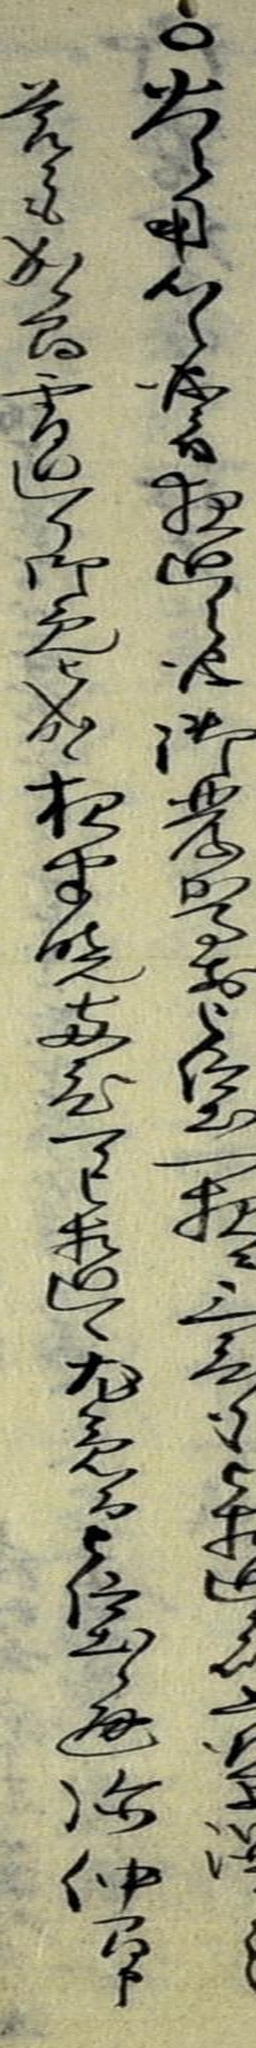節ニも成候間宵廻り御免被成候夜半暁両度可被相廻候尤兼而被仰出候通弥仲間申
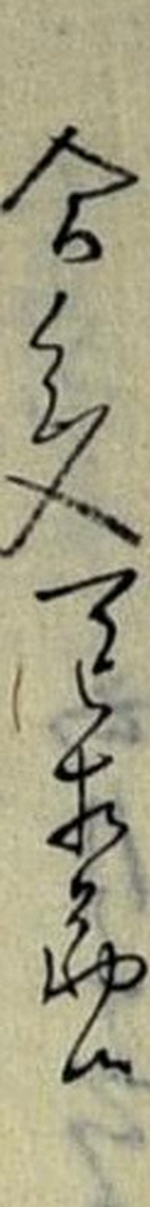合念入可被相勤候
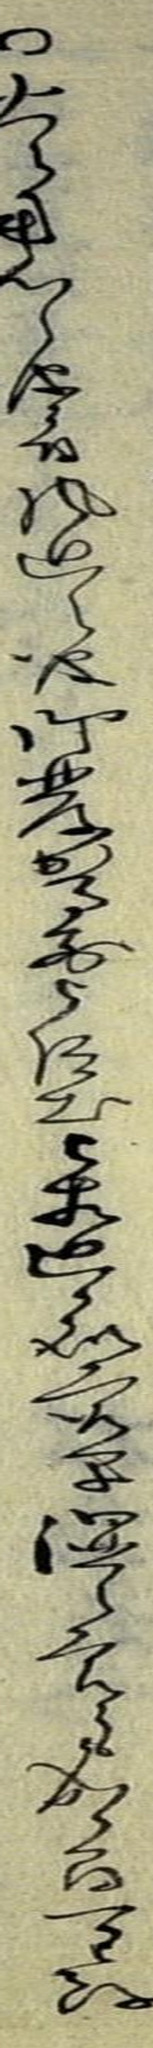〇火之用心之儀ニ付風廻之儀御発駕前被仰出被相廻候処最早湿之節ニも成候間可被致
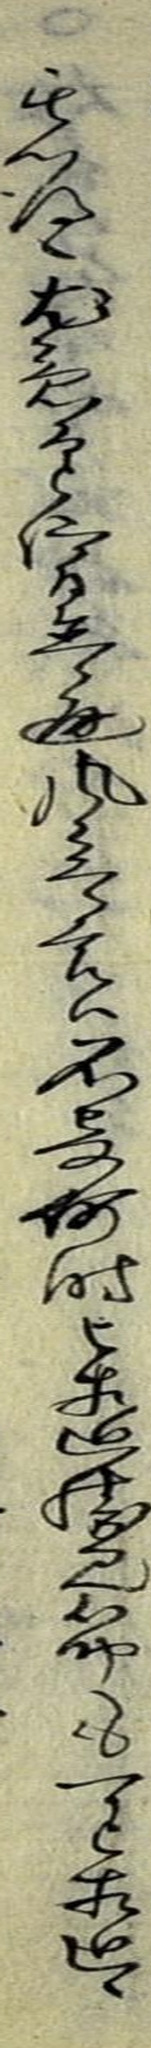其心得候尤兼而被仰付置候通風立候節ハ不寄何時被相廻勝見筋へも可被相廻候
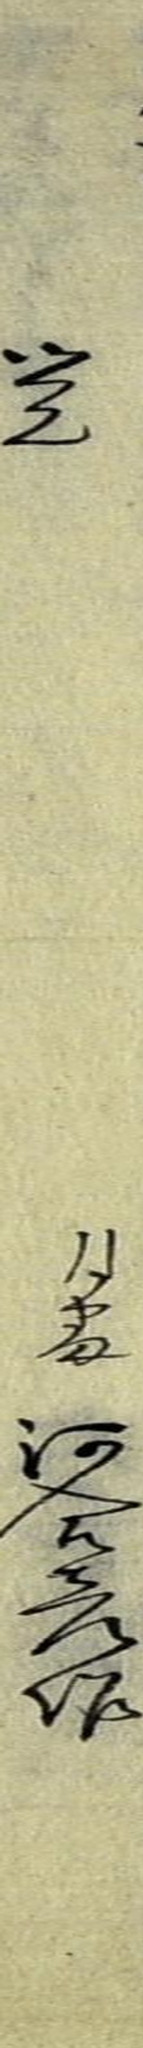覚月番河合彦作
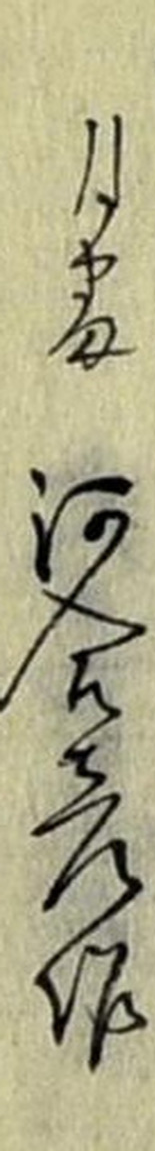覚月番河合彦作
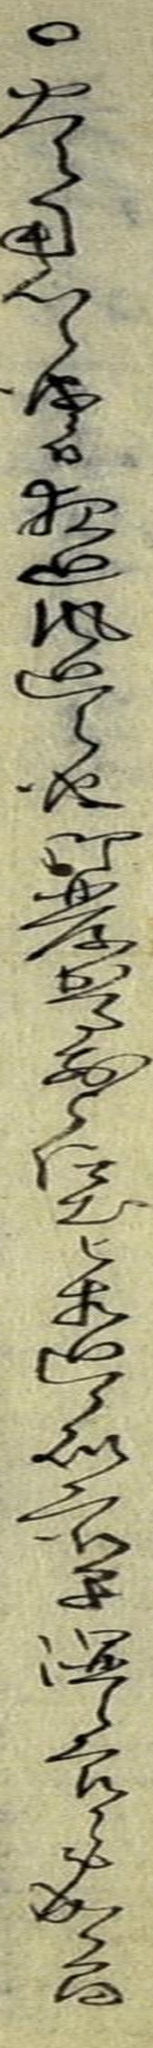〇火之用心之儀ニ付夜廻風廻之儀御発駕前被仰出被相廻候処最早湿之節ニも成候間
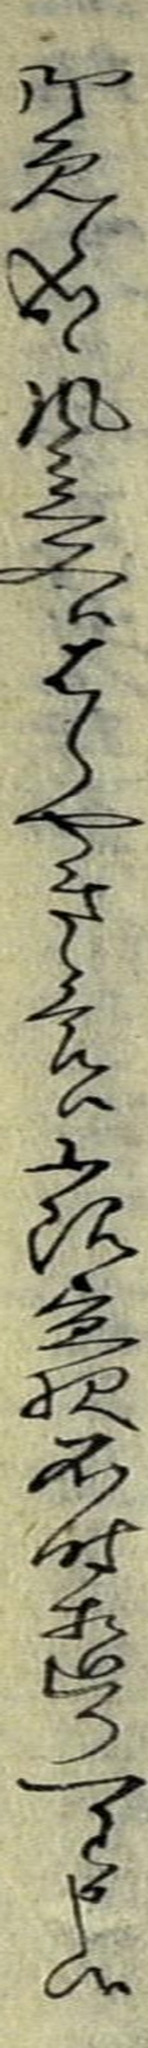御免被成候風立又ハはしやき候節ハ不限昼夜不時相廻り可被申候
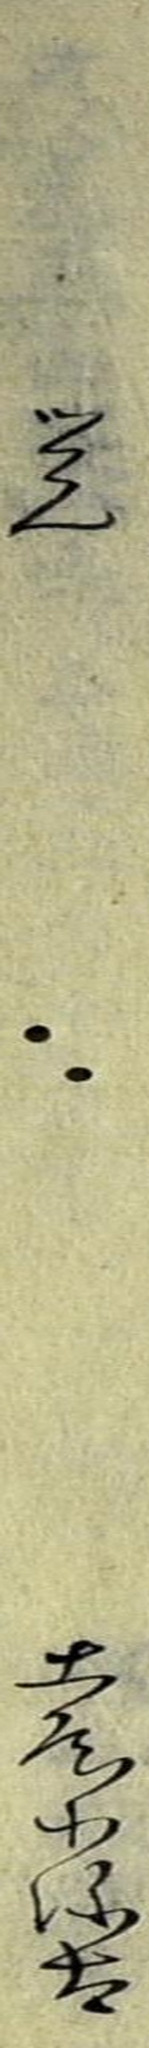覚土屋小弥太
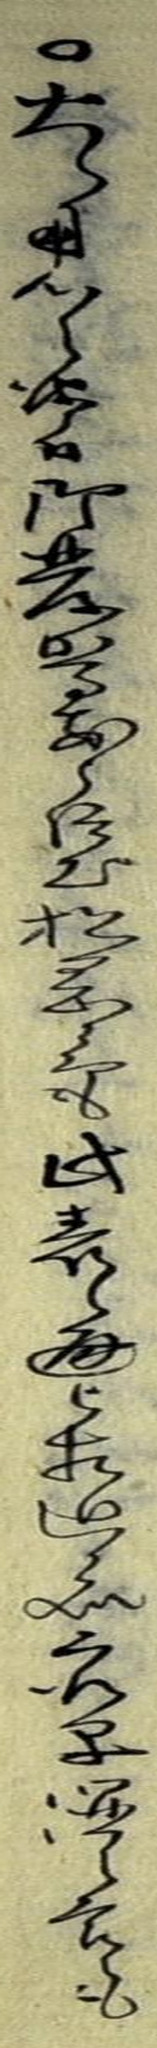〇火之用心之儀ニ付御発駕前被仰出松岡ニ而も此表之通被相廻候処最早湿之節ニも

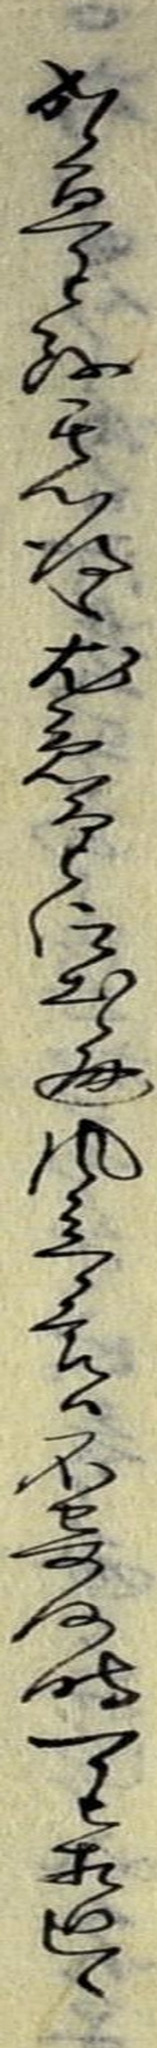成候間可被致其心得候尤兼而被仰出候通風立候節ハ不寄何時可被相廻候
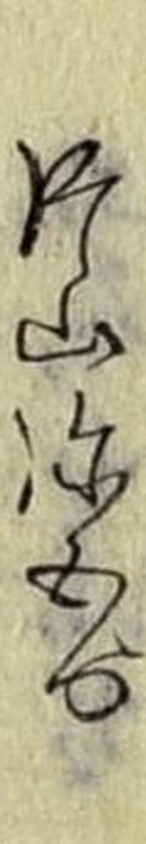覚片山弥五右衛門
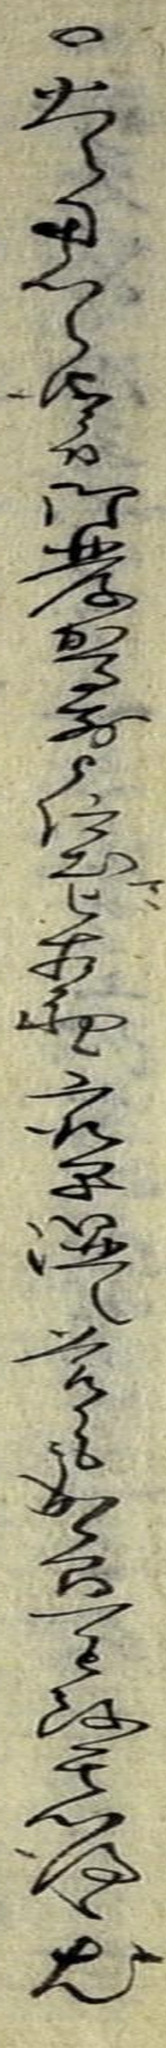〇火之用心之儀ニ付御発駕前被仰出被相勤候最早湿之節ニも成候間可被致其心得候尤
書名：命令之部 一
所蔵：福井県文書館 Fukui Prefectural Archives
